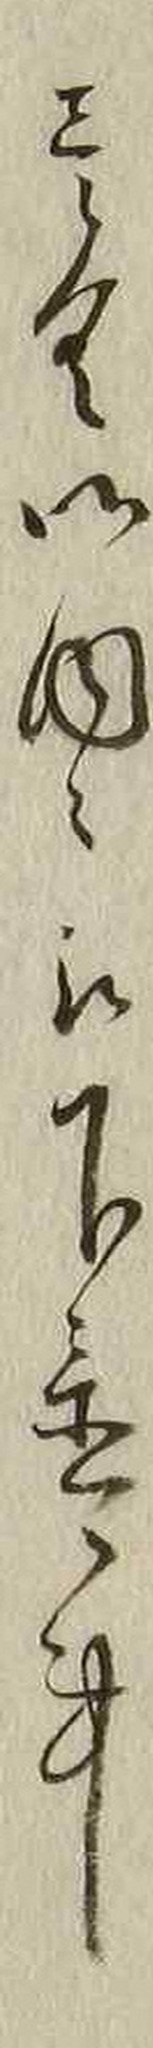壱具御内々被下置候事
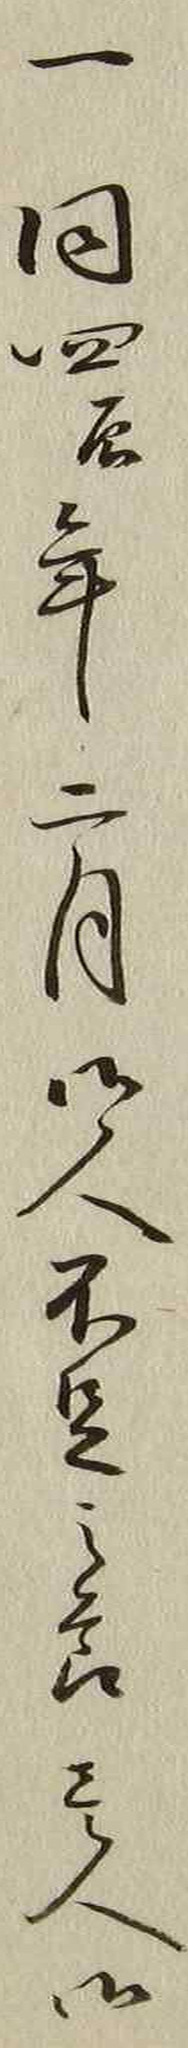一同四辰年二月御人不足之節壱人御
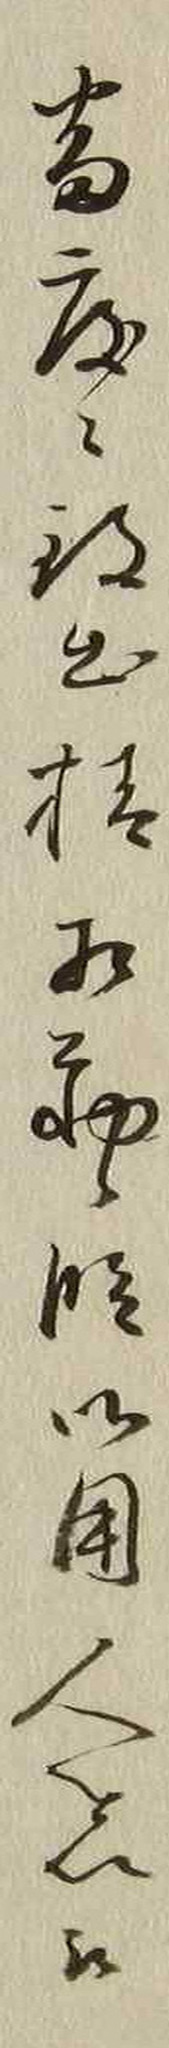番度々致出精相勤候段御用人を以被
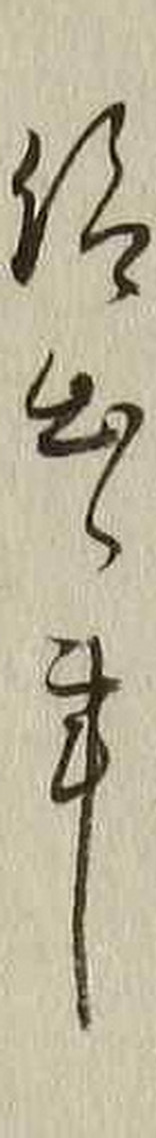仰出候事
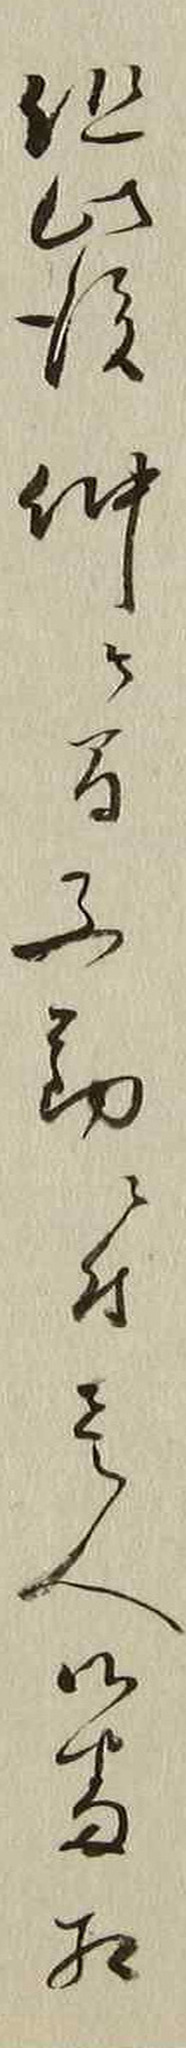但此後仲ケ間不勤ニ付壱人御番相
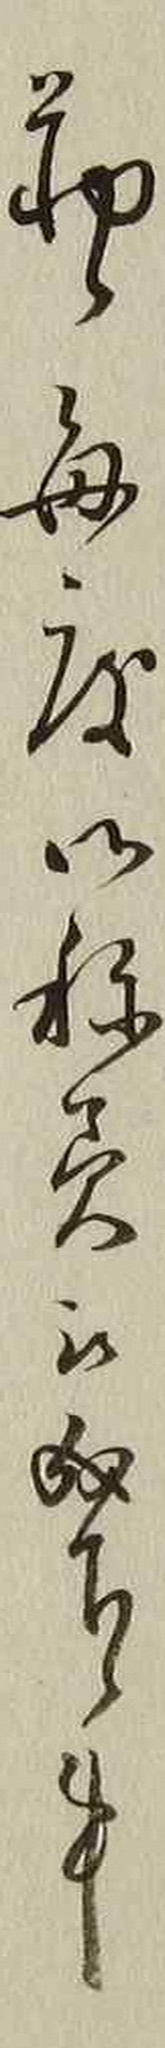勤候毎度御称美被成下候事
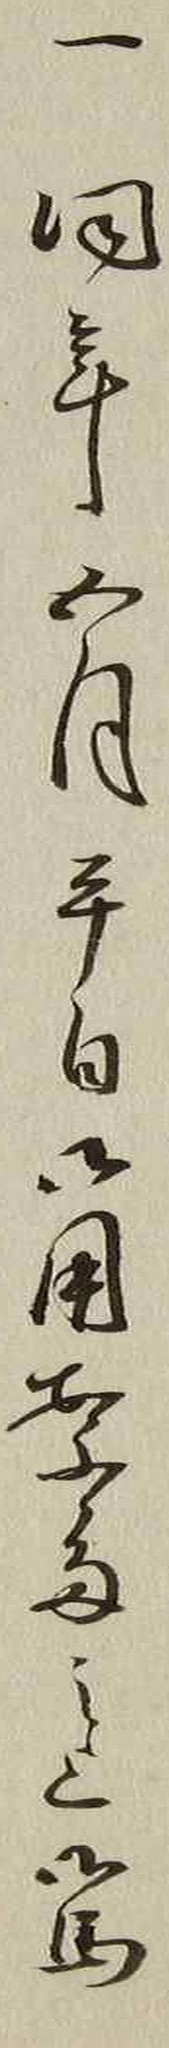一同年五月平日御用繁多之上御馬
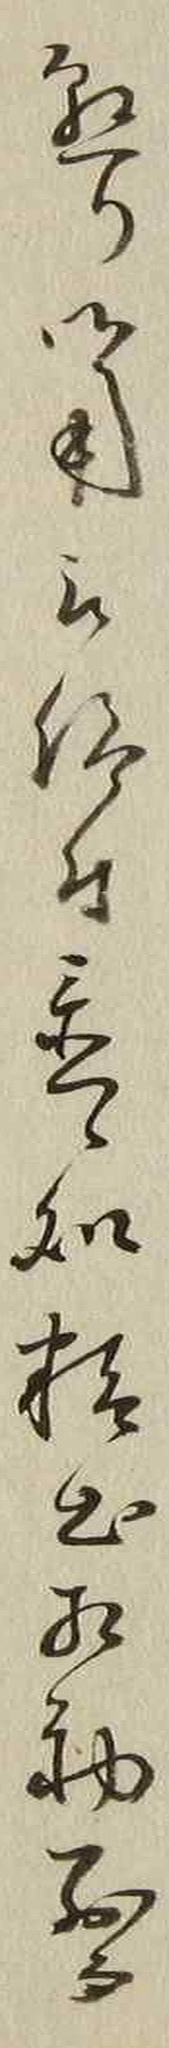懸り御用被仰付置候処精出相勤別而
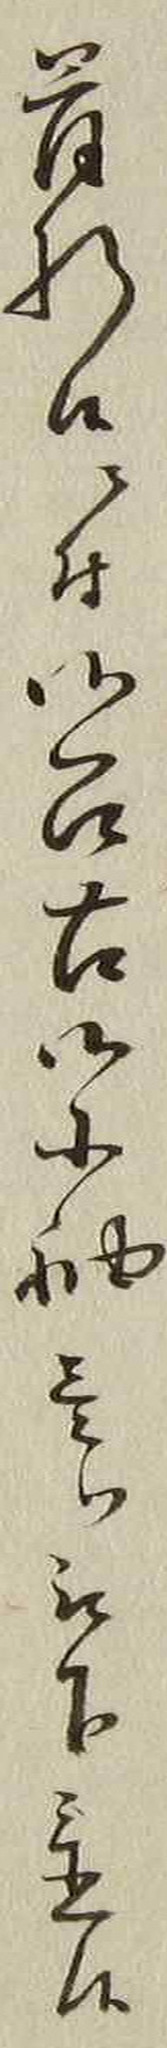骨折候ニ付御召古御小袖壱ツ被下置候
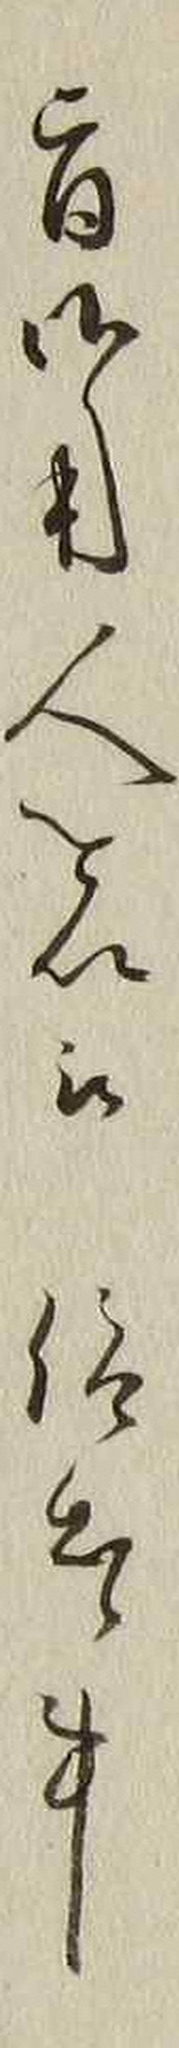旨御用人を以被仰出候事
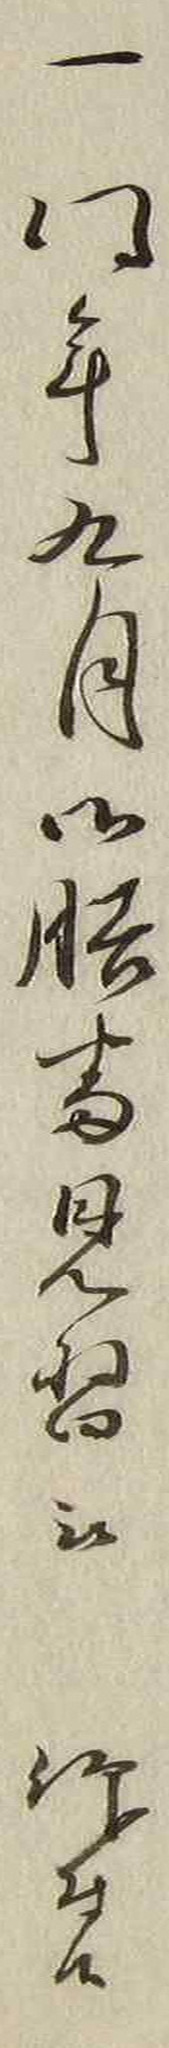一同年九月御膳番見習被仰付候
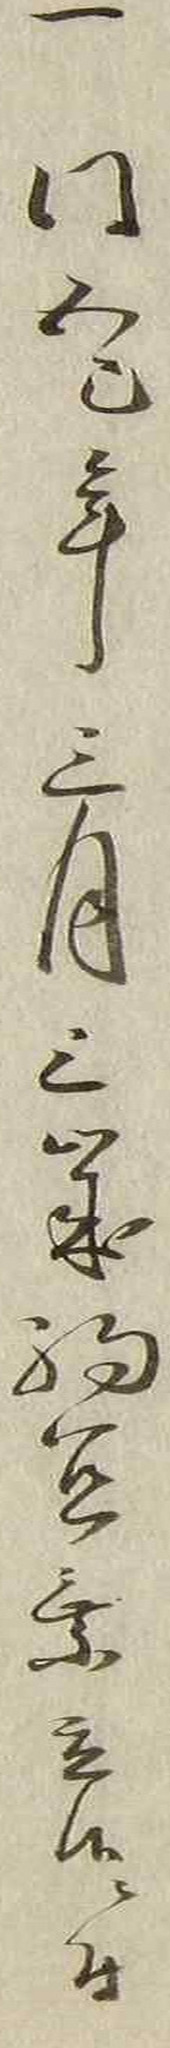一同五巳年三月三歳駒宜乗立候ニ付
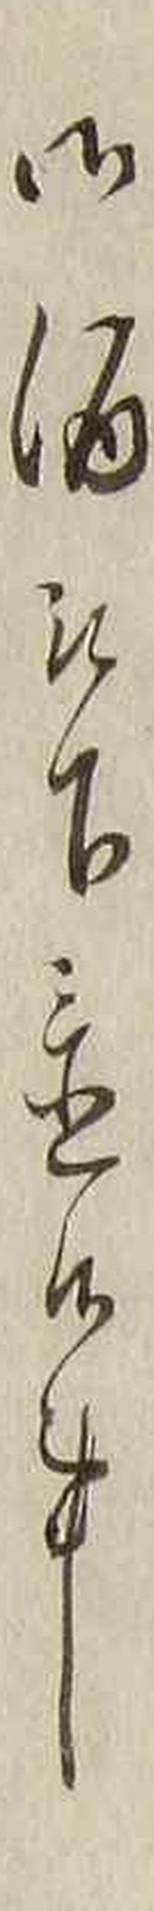御酒被下置候事
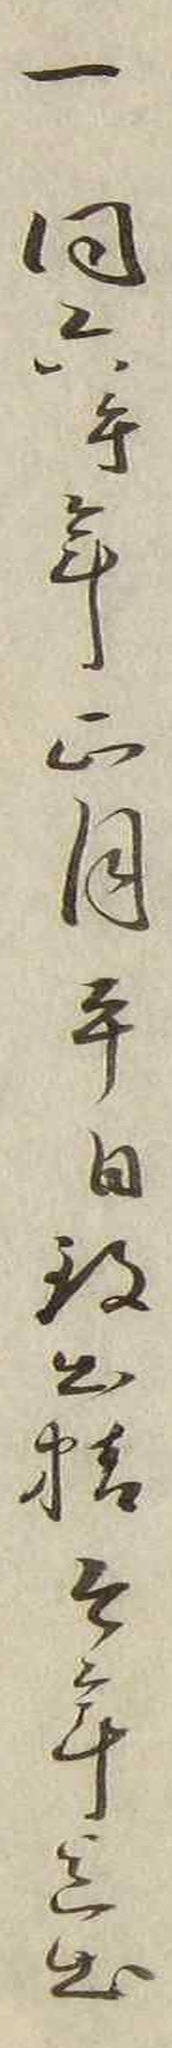一同六午年正月平日致出精今年迄出

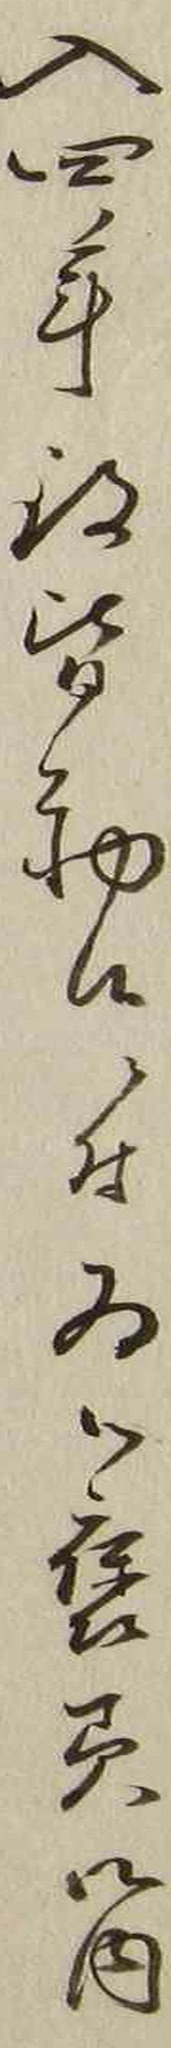入四年ノ致皆勤候ニ付為御褒美御内
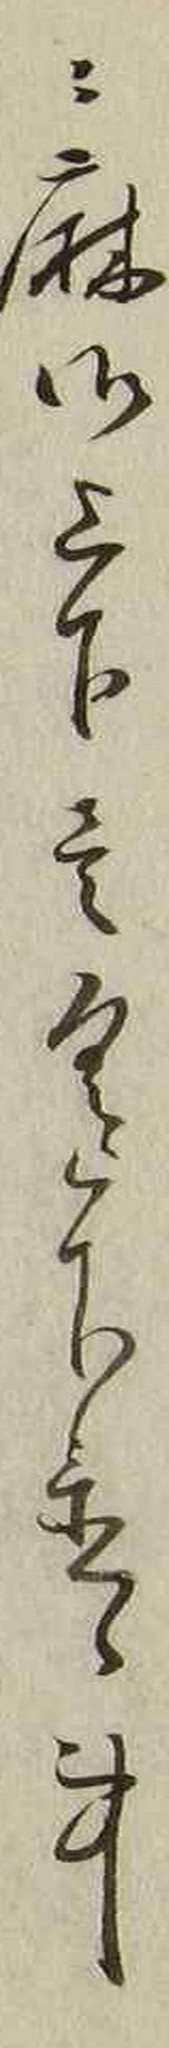々麻御上下壱具被下置候事
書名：諸士系譜　巻之25　い之部25
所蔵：会津若松市立会津図書館
